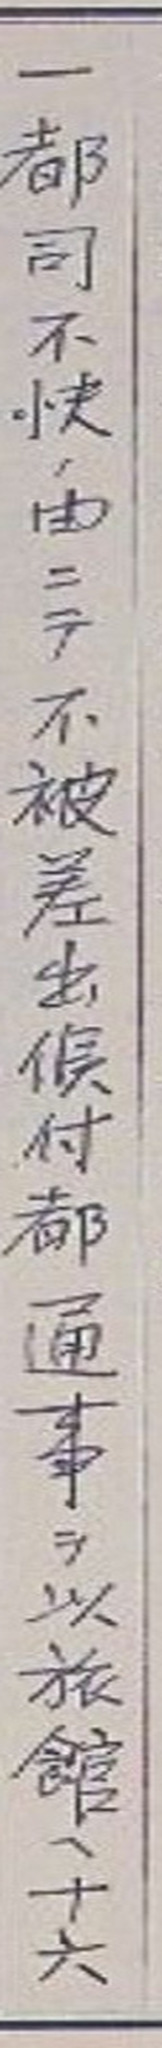一都司不快の由にて不被差出候付都通事を以旅館へ十六
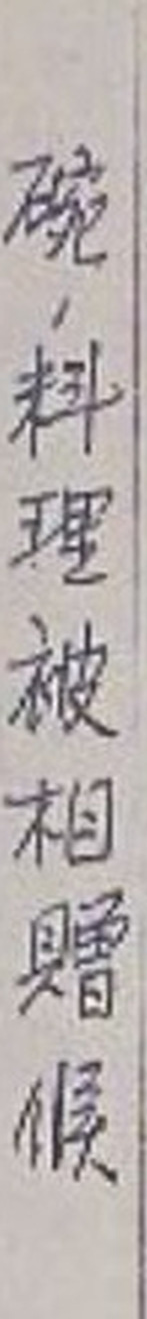碗の料理被相贈候
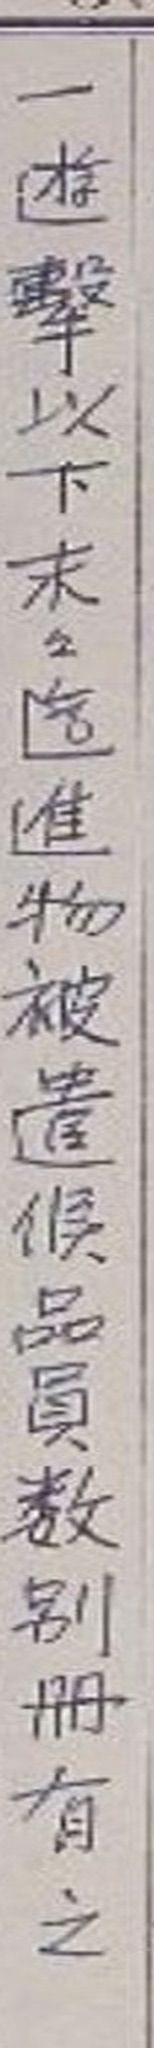一遊撃以下末々迄進物被遣候品員数別冊有之
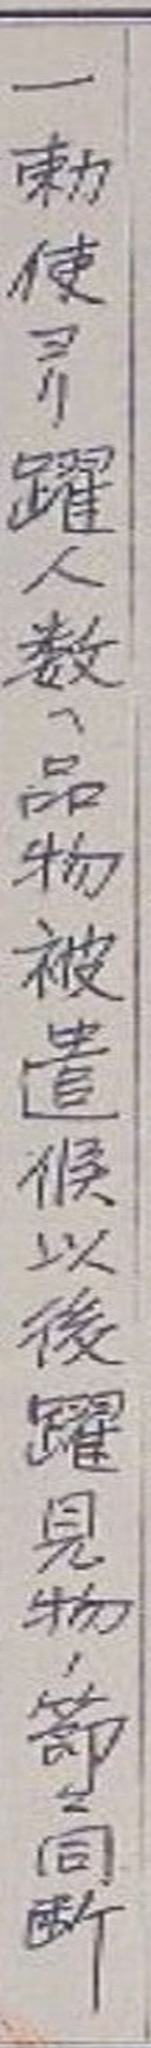一勅使より躍人数へ品物被遣候以後躍見物の節々同断
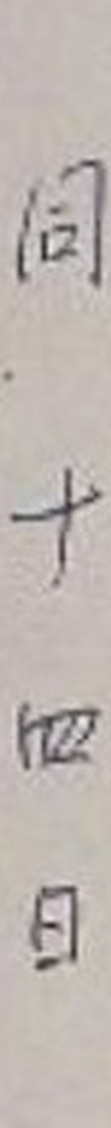同十四日

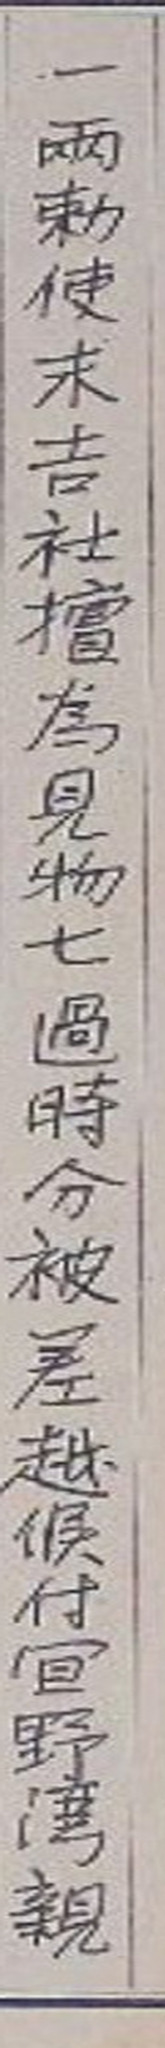一両勅使末吉社檀為見物七過時分被差越候付宜野湾親
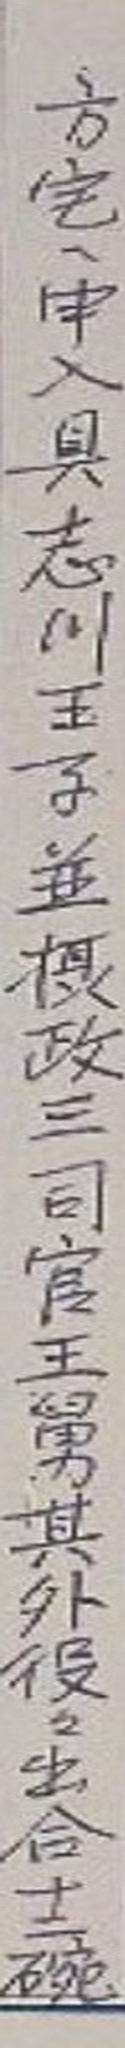方宅へ申入具志川王子並摂政三司官王舅其外役々出合十二碗
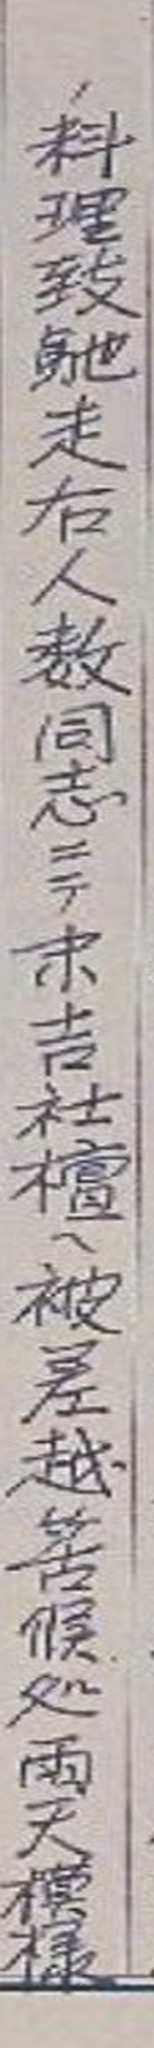の料理致馳走右人数同志にて末吉社檀へ被差越筈候処雨天模様
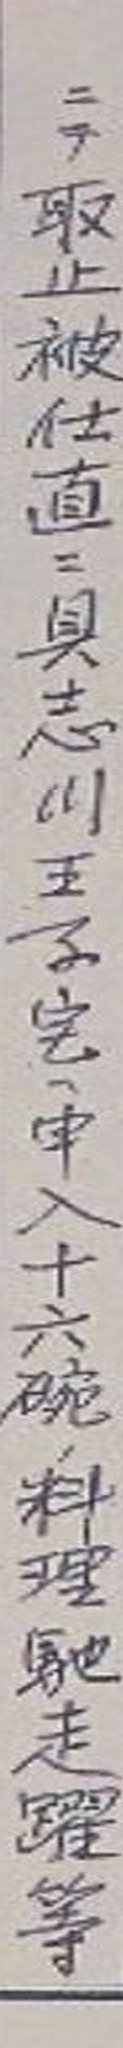にて取止被仕直に具志川王子宅へ申入十六碗の料理馳走躍等
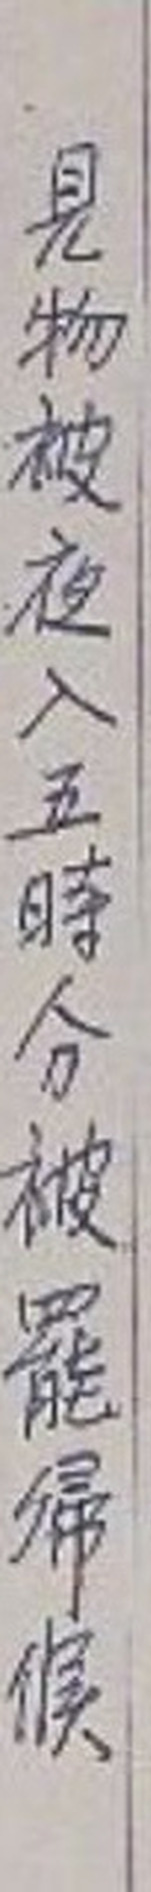見物被夜入五時分被罷帰候
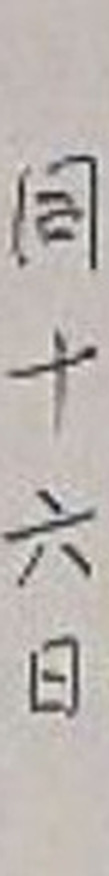同十六日
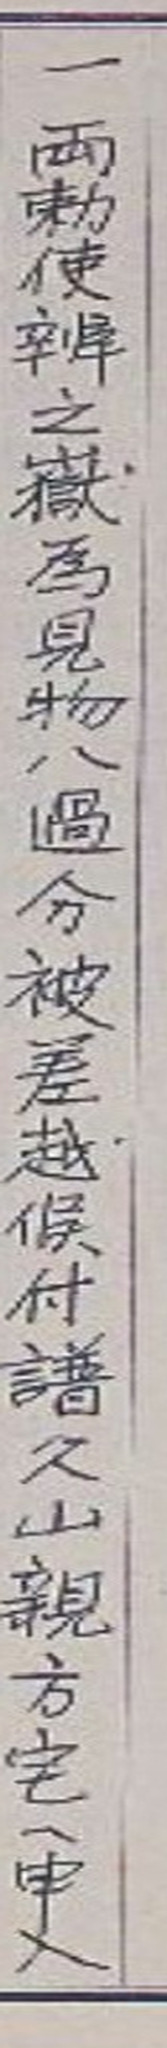一両勅使弁之嶽為見物八過分被差越候付譜久山親方宅へ申入
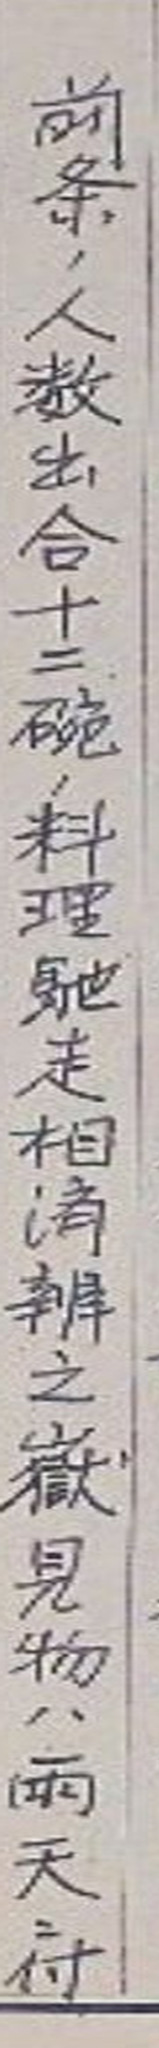前条の人数出合十二碗の料理馳走相済弁之嶽見物は雨天に付
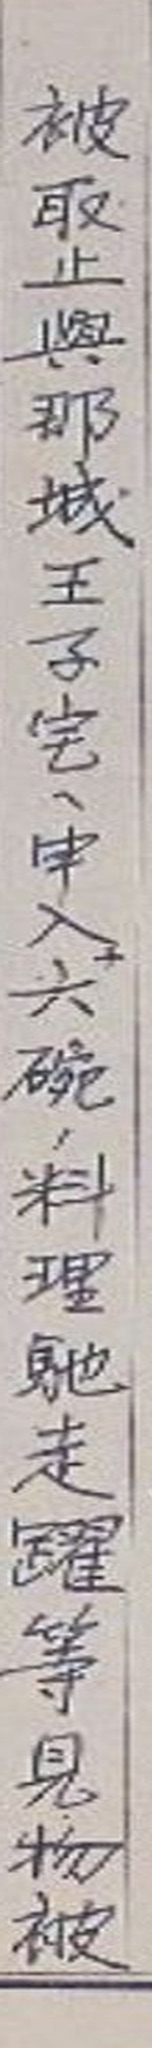被取止与那城王子宅へ申入十六碗の料理馳走躍等見物被
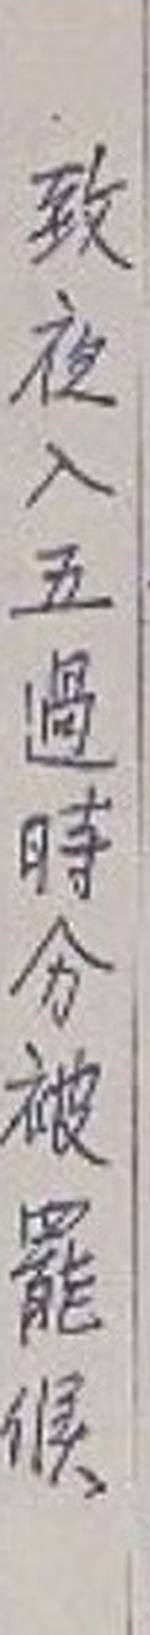致夜入五過時分被罷候
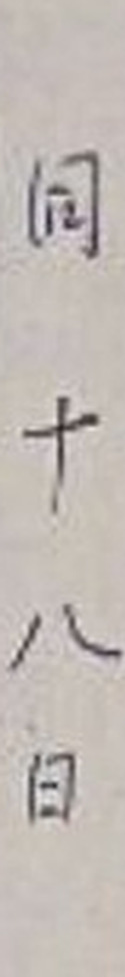同十八日
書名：支那冊封使来琉諸記 下巻
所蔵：University of the Ryukyus Library
